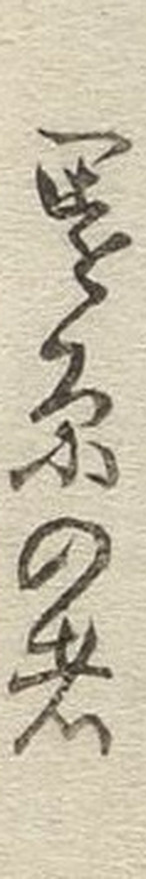園原の者
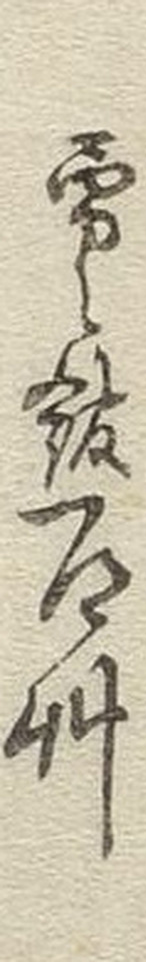勇々館道草
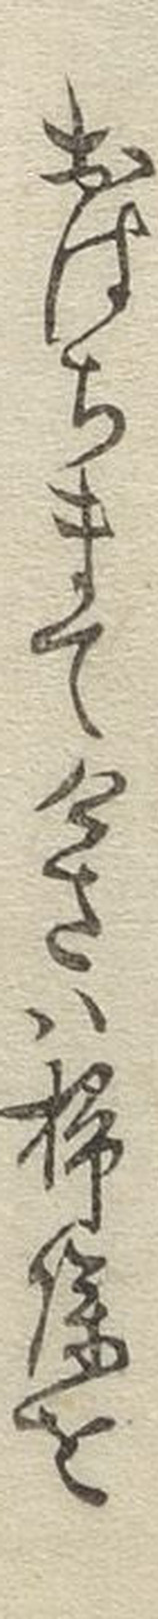おはちまてけさは掃除を
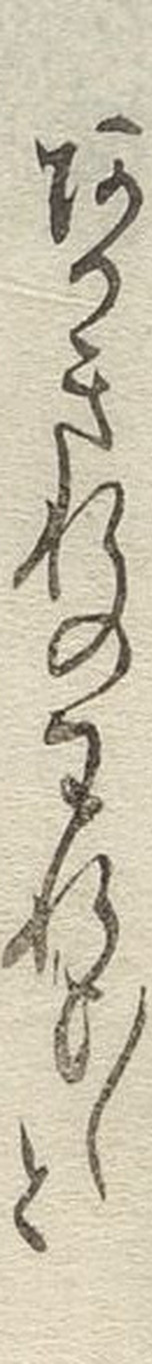あかきれのわれも〳〵と
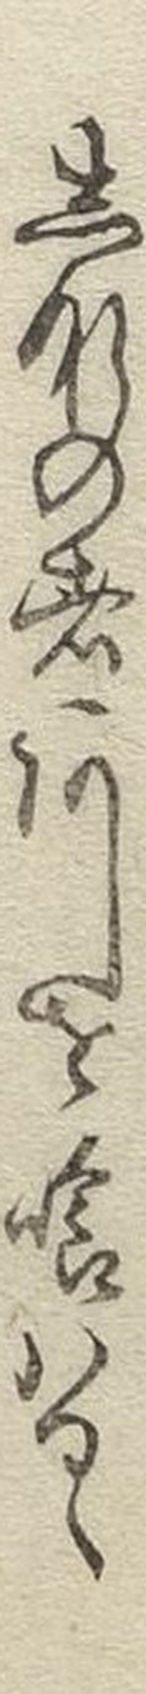しなの者あしを喰はるゝ
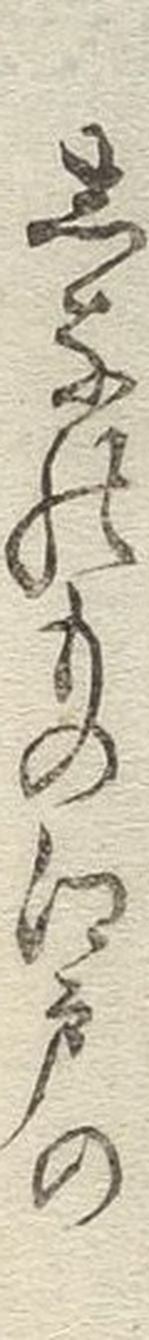しなのもの江戸の
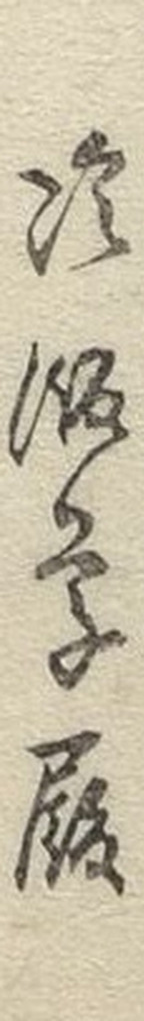冷飯草履
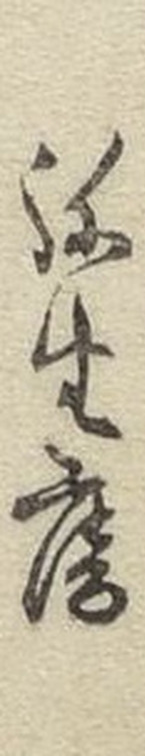弥生麿
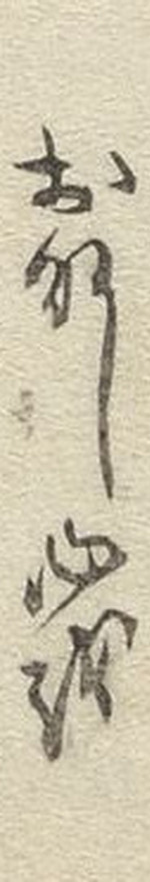おなし心を
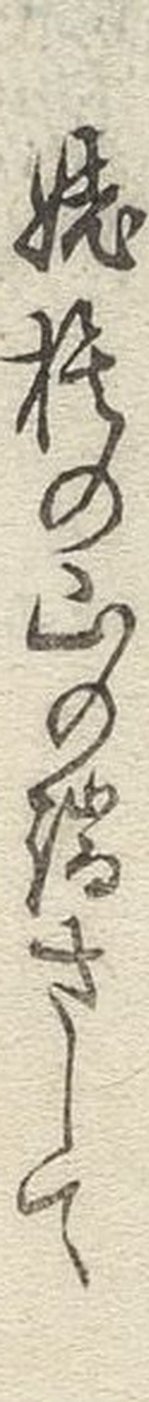姥捨の山の端さして
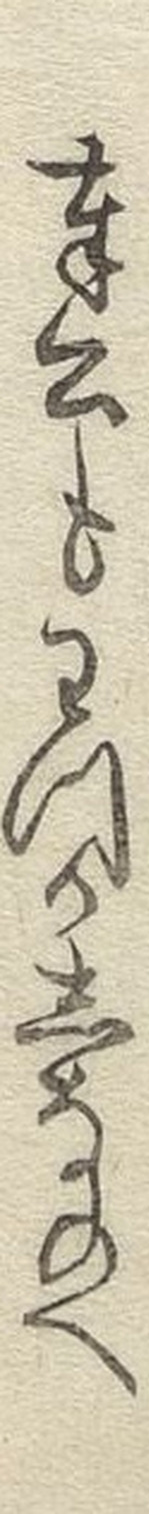奉公もわつかしなのへ
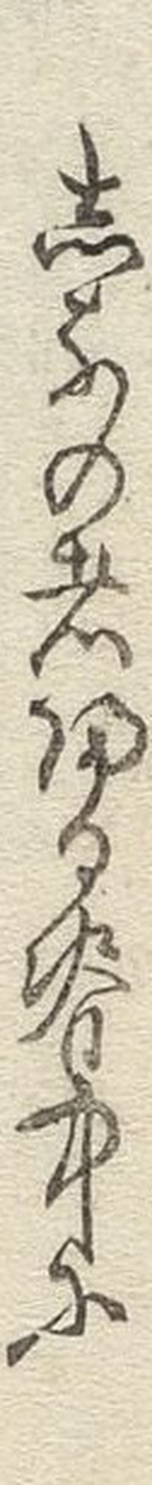しなの者帰る背中に
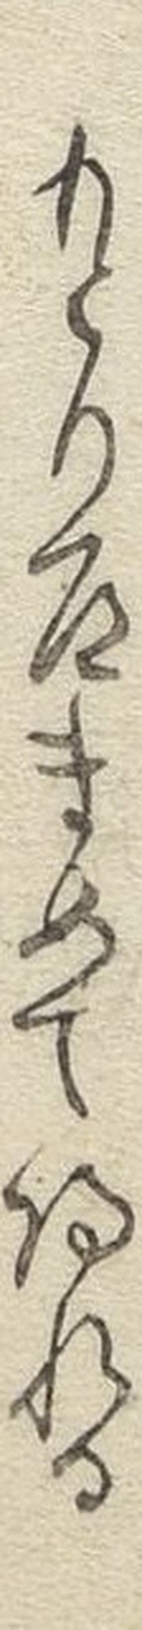もとり道まめて帰れる
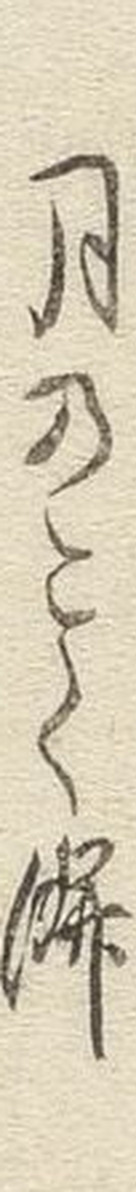月のこく餅
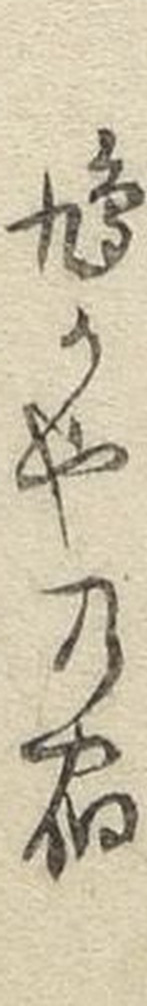鳩かやの宿
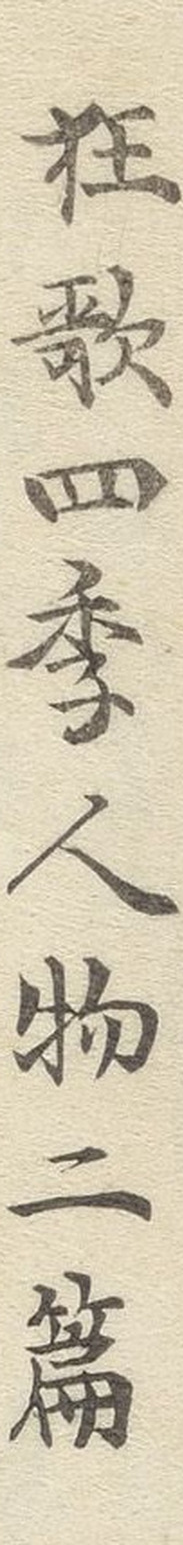狂歌四季人物二篇
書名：Picture Album of People with Kyōka (Light Verse) (Kyōka shiki jinbutsu 狂歌四季人物)
